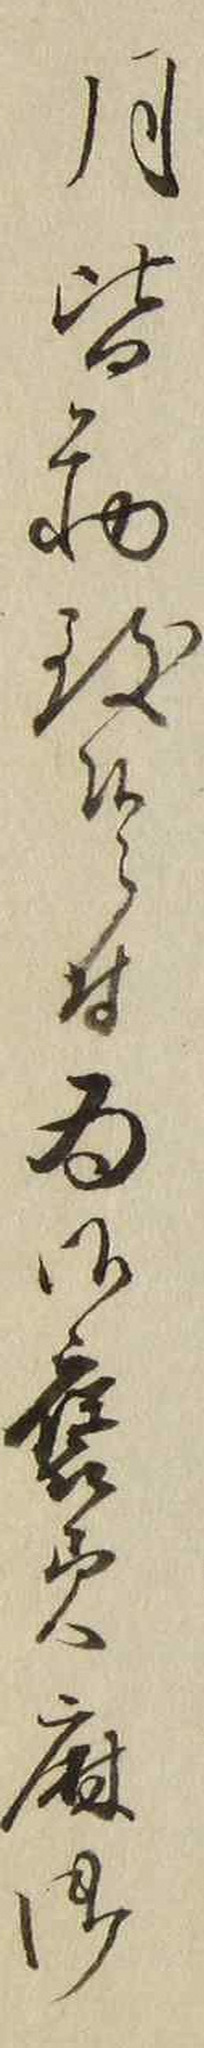月皆勤致候に付為御褒美麻御

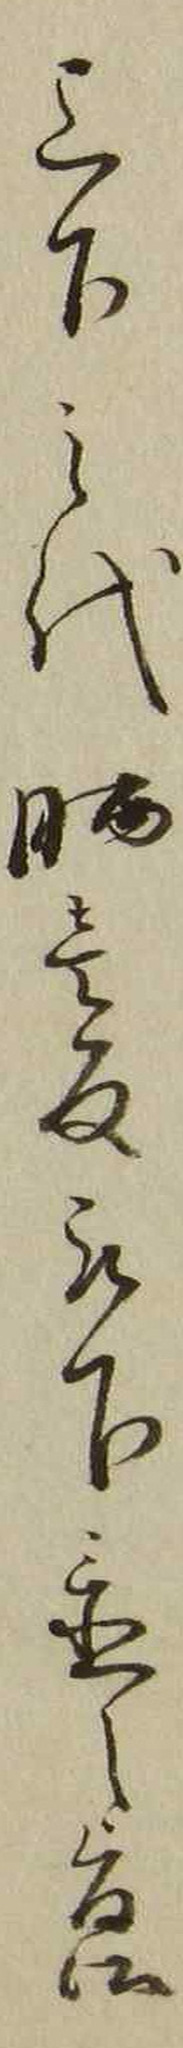上下の代晒壱反被下置の旨御
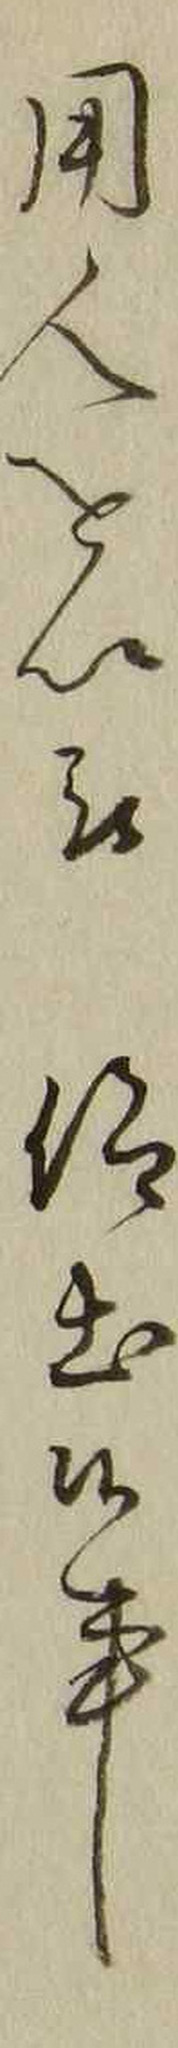用人を以被仰出候事
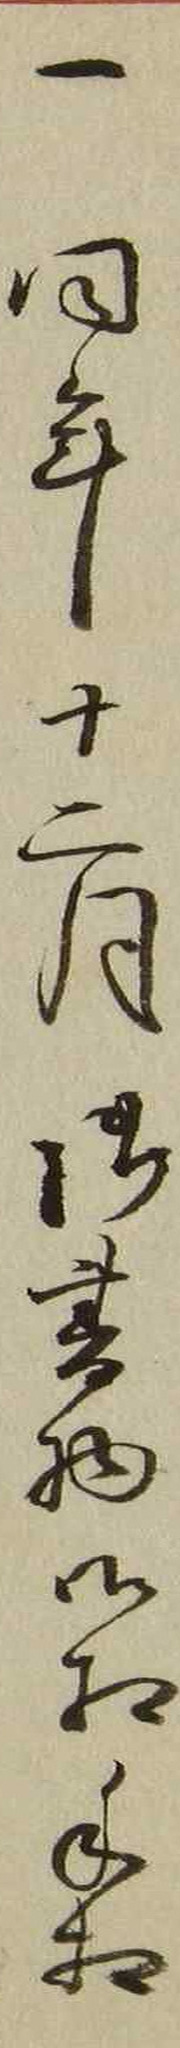一同年十二月御書物御相手相
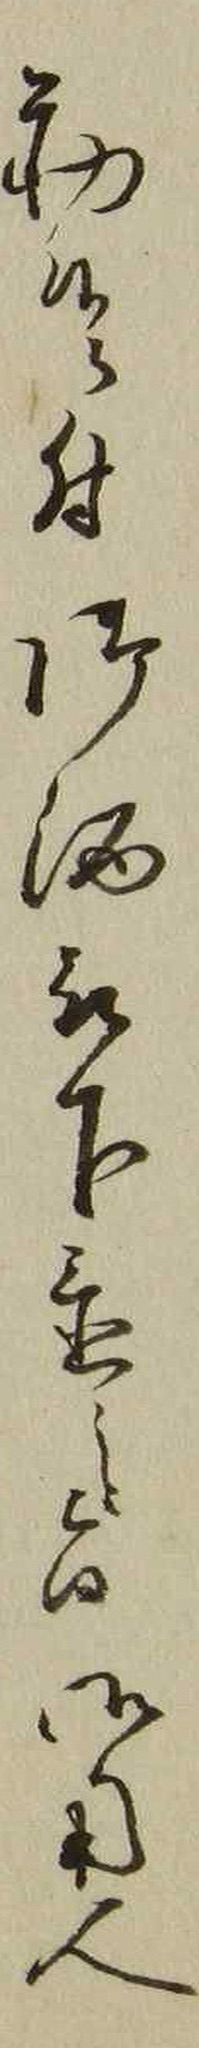勤候に付御酒被下置の旨御用人
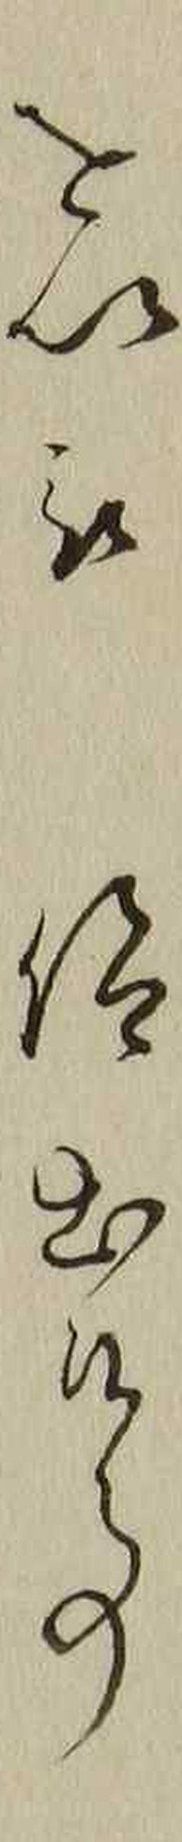を以被仰出候事
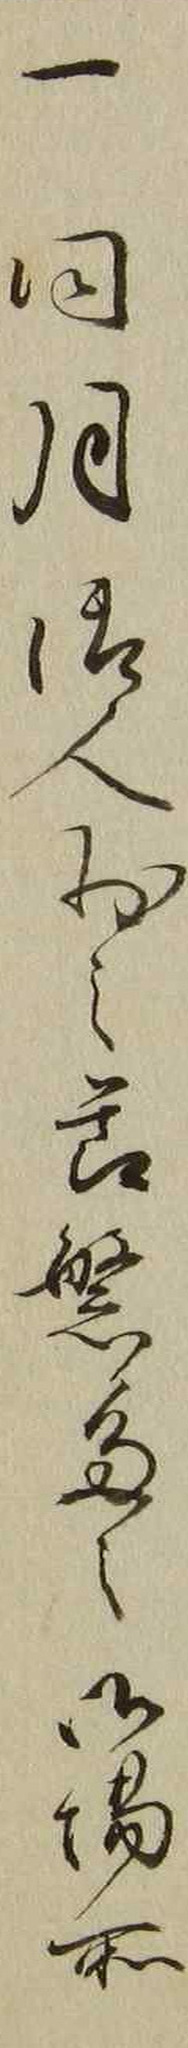一同月御人少の節繁多の御場所
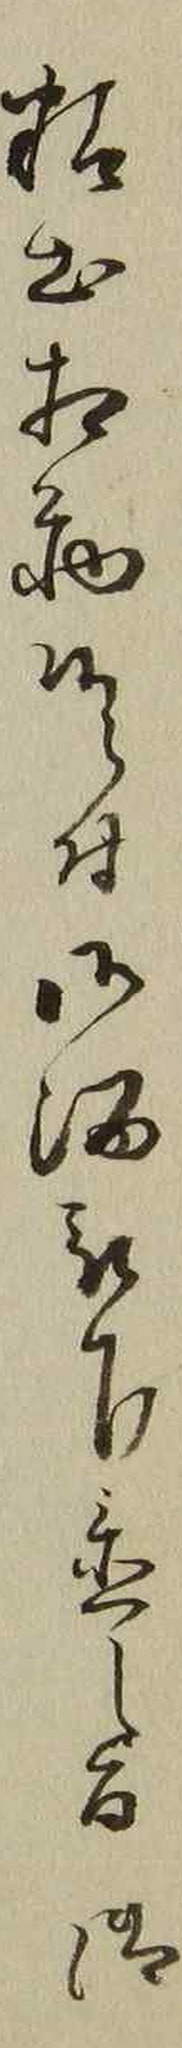精出相勤候に付御酒被下置の旨御
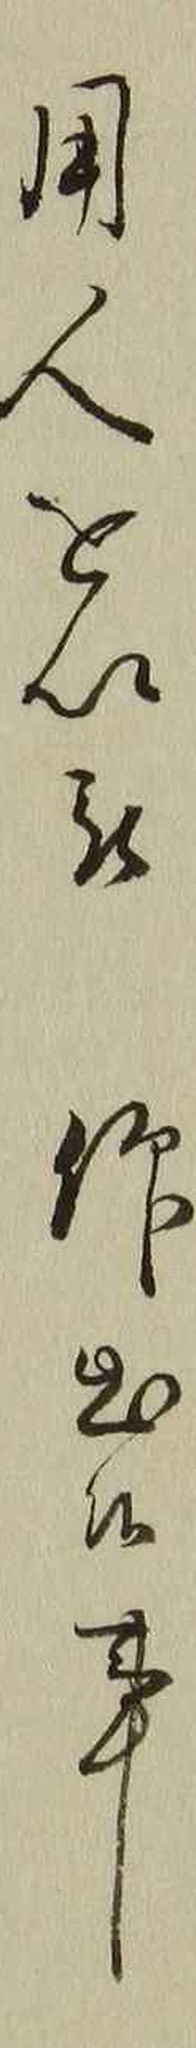用人を以被仰出候事
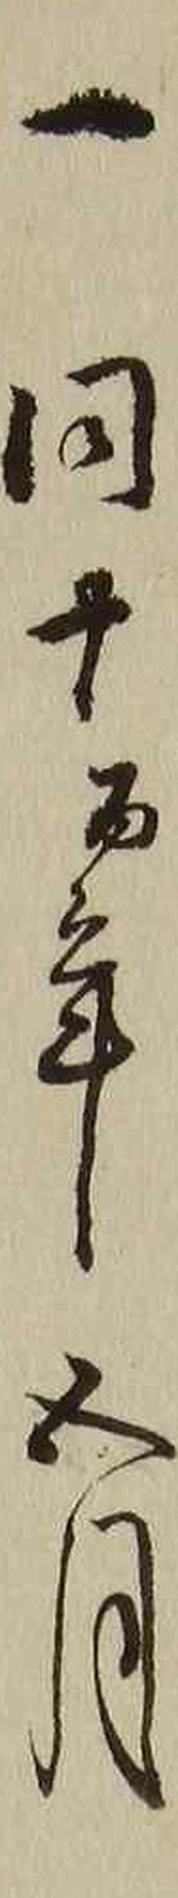一同十酉年五月
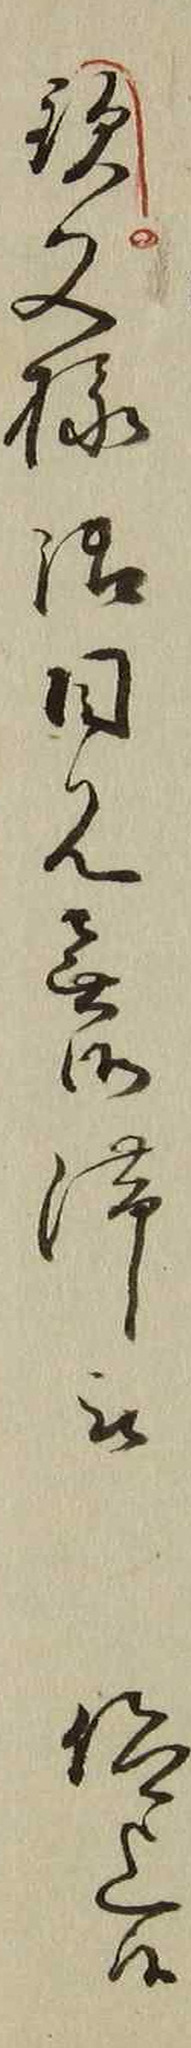欽文様御目見無御滞被仰上候
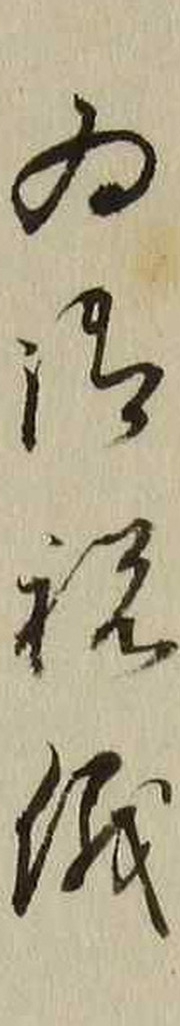為御祝儀
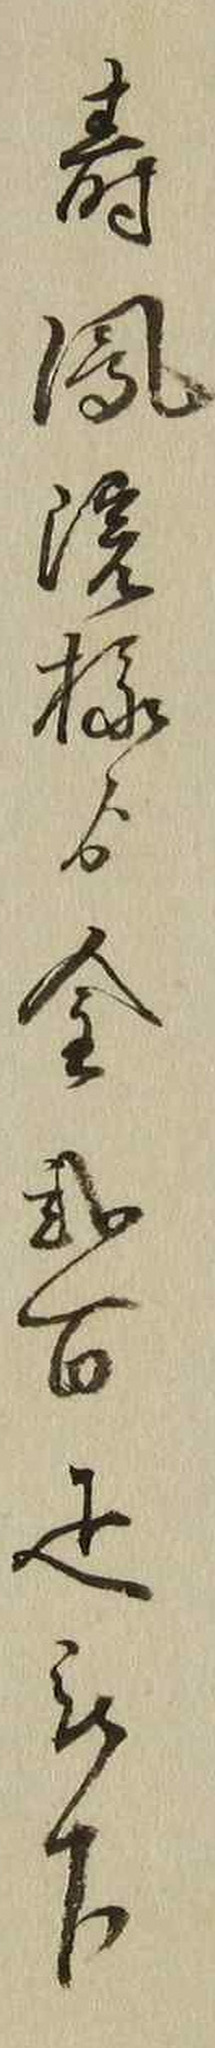壽鳳院様ゟ金弐百疋被下
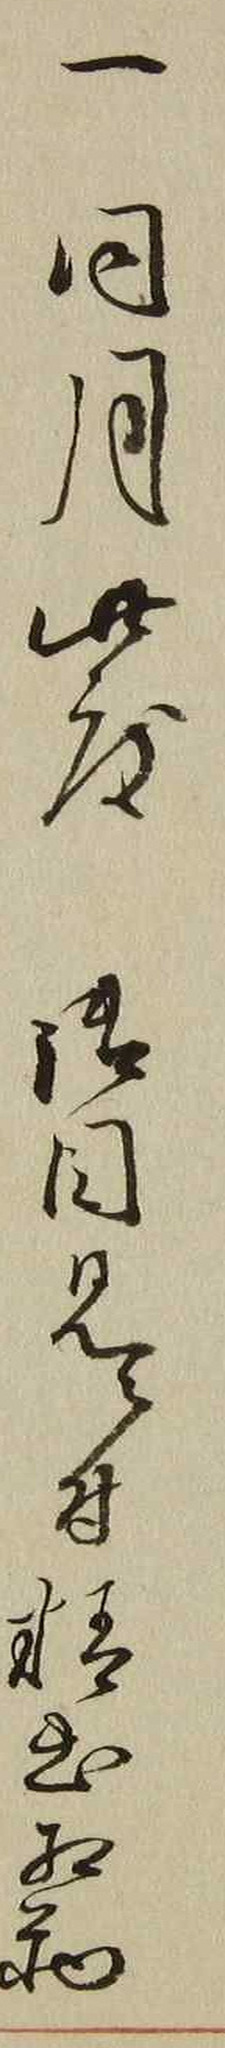一同月此度御目見に付精出相勤
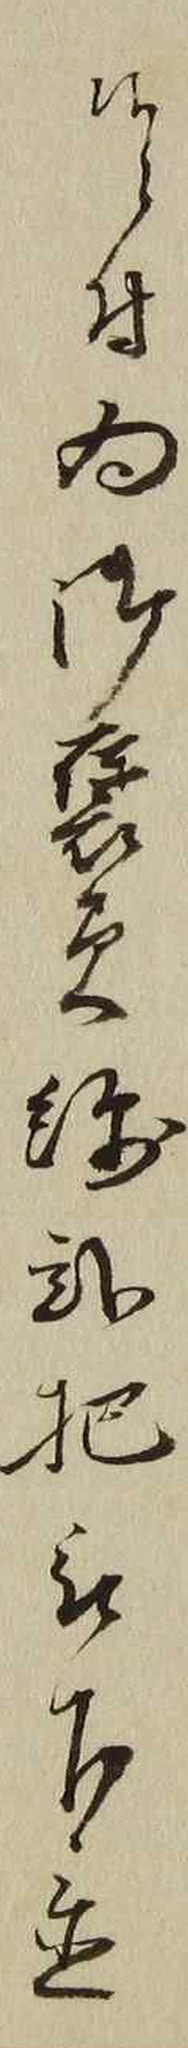候に付御褒美綿弐把被下置
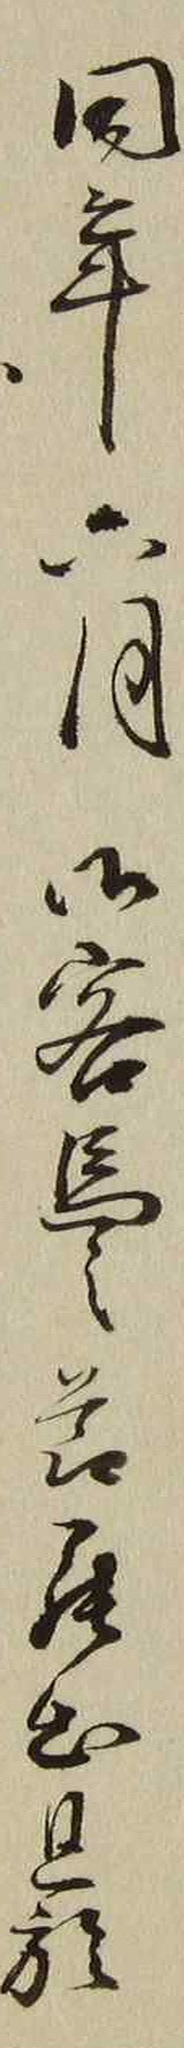同年六月御客馬の節罷出且於
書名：諸士系譜　巻之1　い之部1
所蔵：会津若松市立会津図書館
